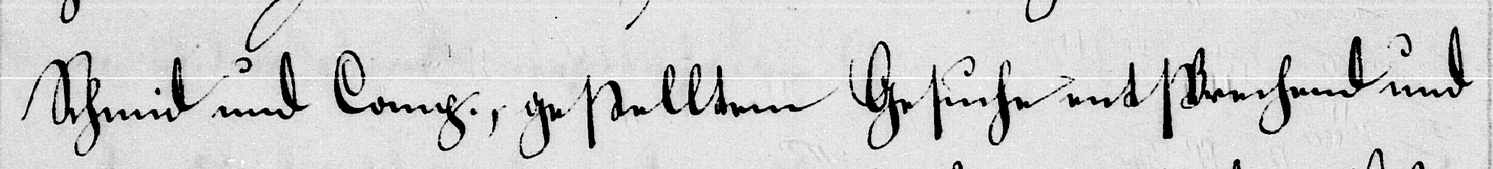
Schmid und Comp., gestellten Gesuche entsprechend und
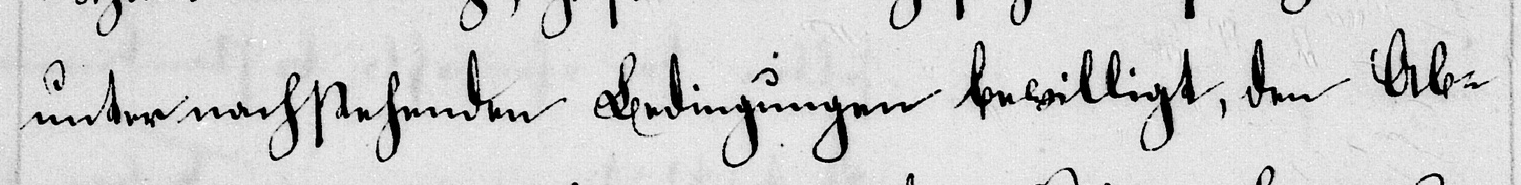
unter nachstehenden Bedingungen bewilligt, den Ab¬
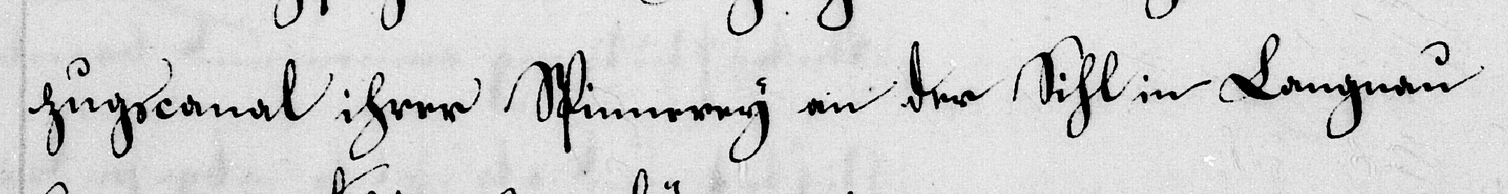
zugscanal ihrer Spinnerey an der Sihl in Langnau
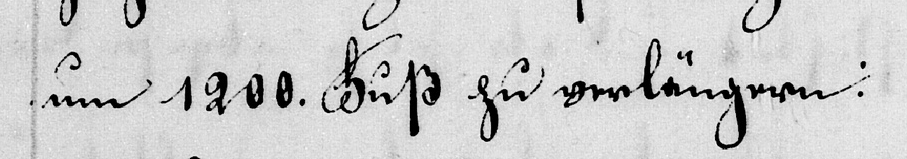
um 1200. Fuß zu verlängern:
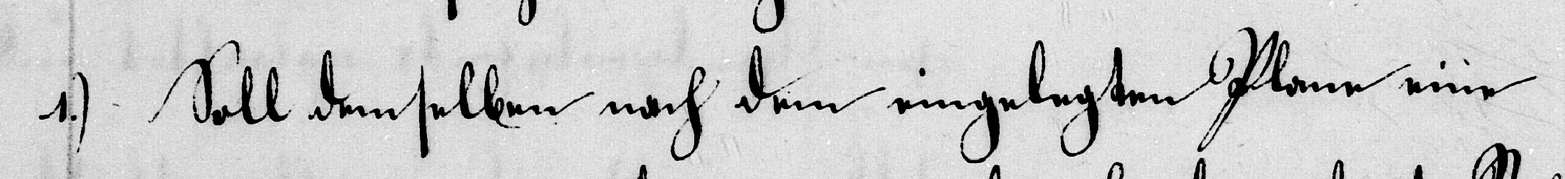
1.) Soll demselben nach dem eingelegten Plane eine
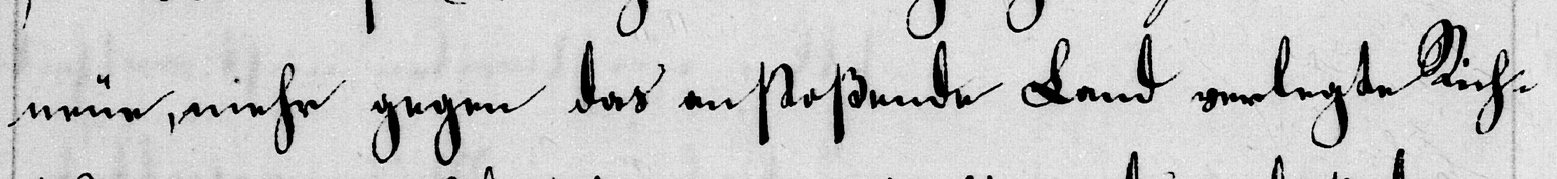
neue, mehr gegen das anstoßende Land verlegte Rich¬
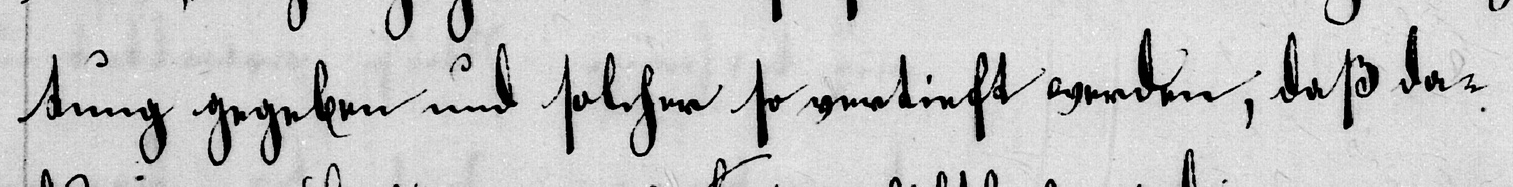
tung gegeben und solcher so vertieft werden, daß da¬
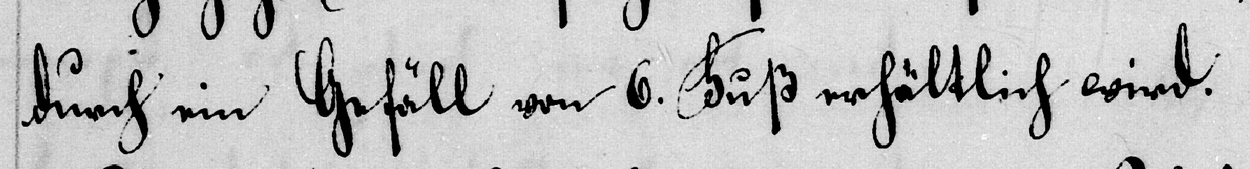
durch ein Gefäll von 6. Fuß erhältlich wird.
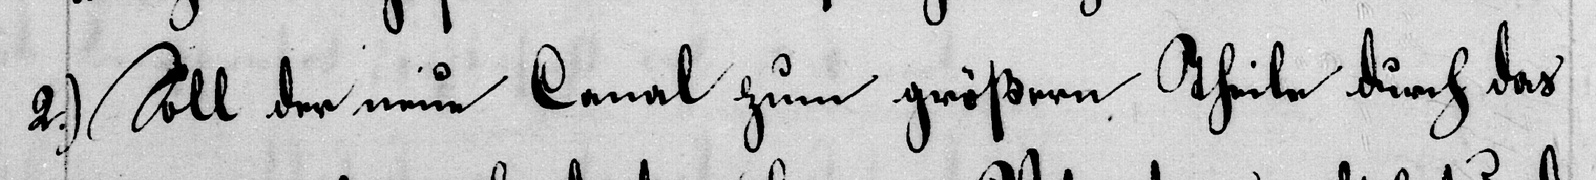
2.) Soll der neue Canal zum größern Theile durch das
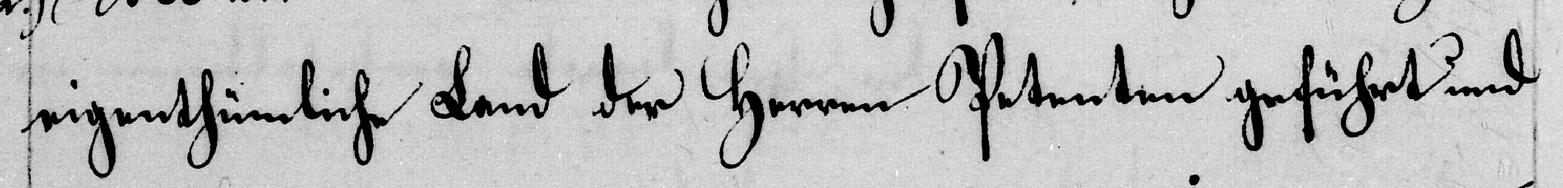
eigenthümliche Land der Herren Petenten geführt und
